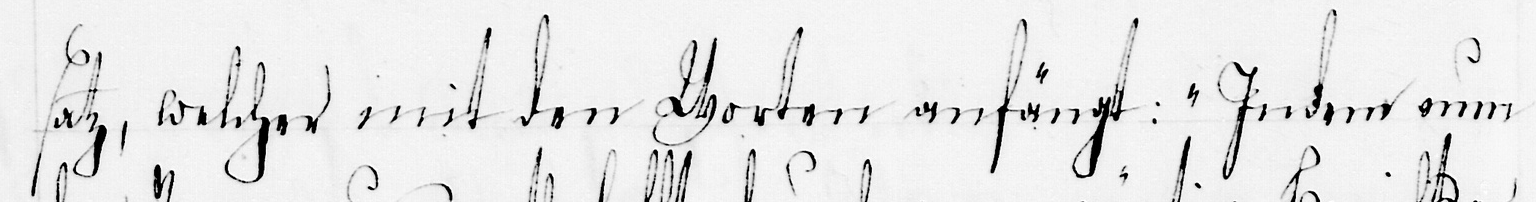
satz, welcher mit den Worten anfängt: „Indem nun
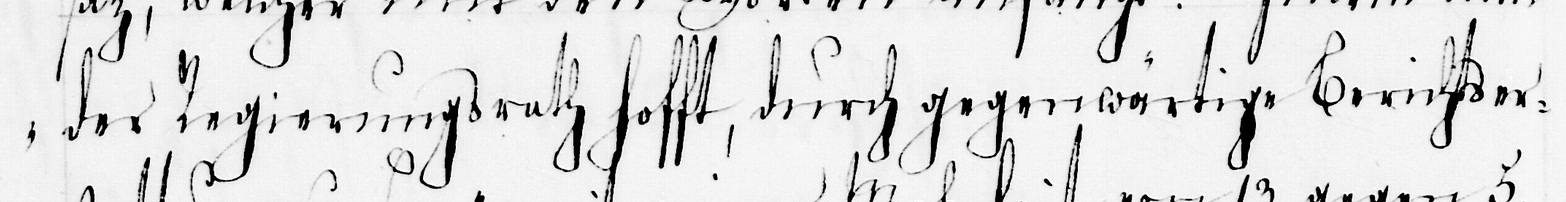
der Regierungsrath hofft, durch gegenwärtige Berichtser¬
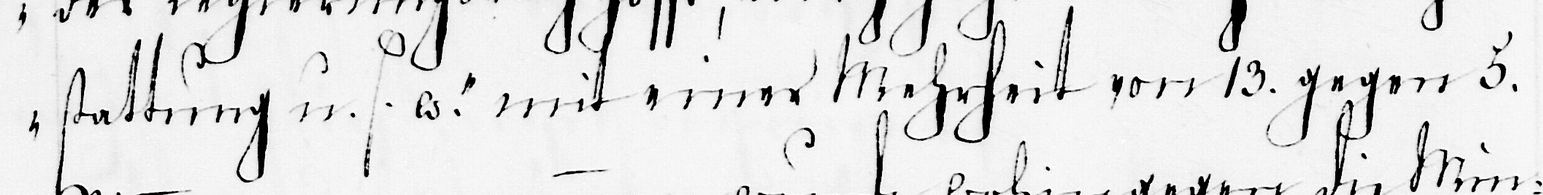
stattung u. s. w.“ mit einer Mehrheit von 13. gegen 5.
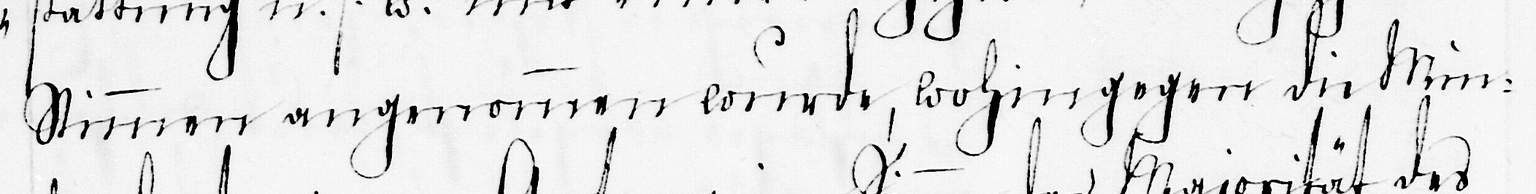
Stimmen angenommen wurde, wohingegen die Min¬
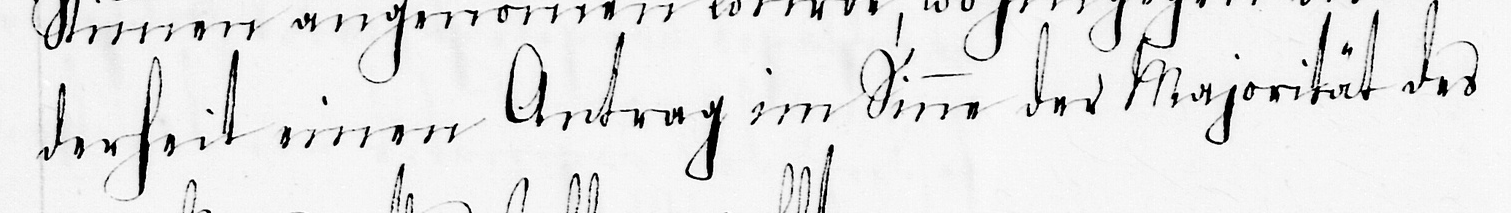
derheit einen Antrag im Sinne der Majorität des
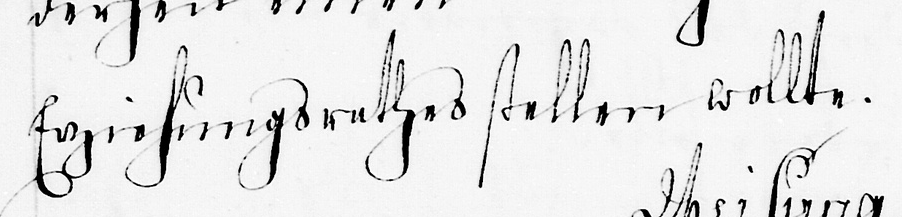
Erziehungsrathe stellen wollte.
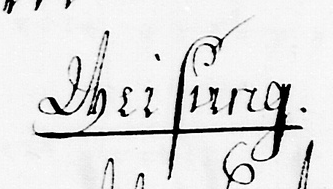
Weisung.
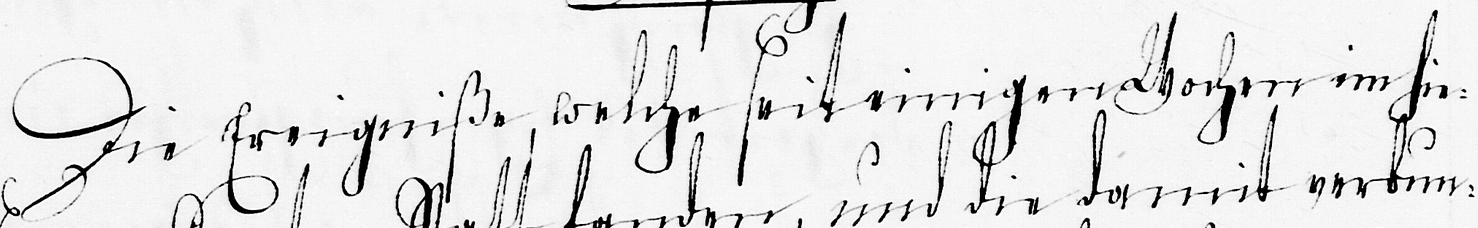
Die Ereigniße, welche seit einigen Wochen im hi¬
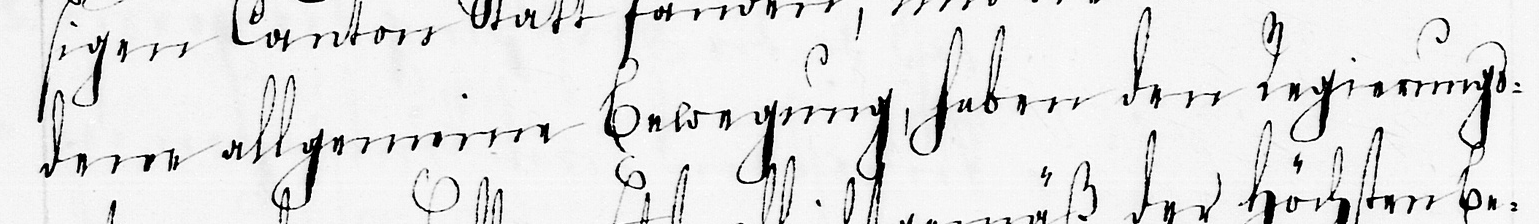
dene allgemeine Bewegung, haben den Regierungs¬
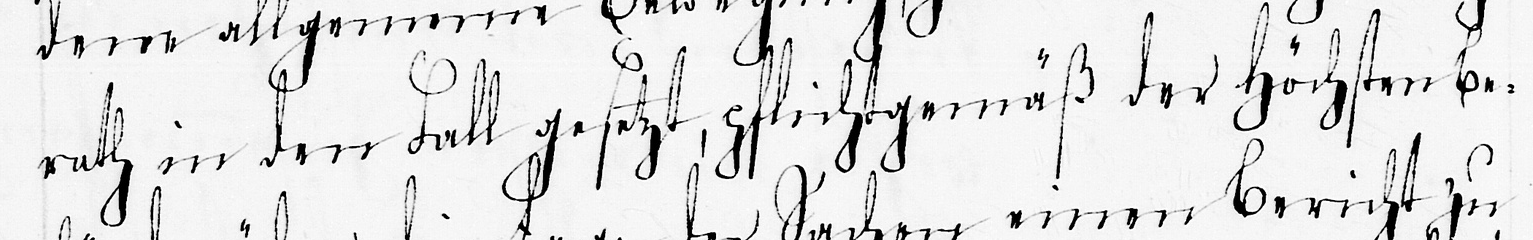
rath in den Fall gesetzt, pflichtgemäß der Höchsten Be¬
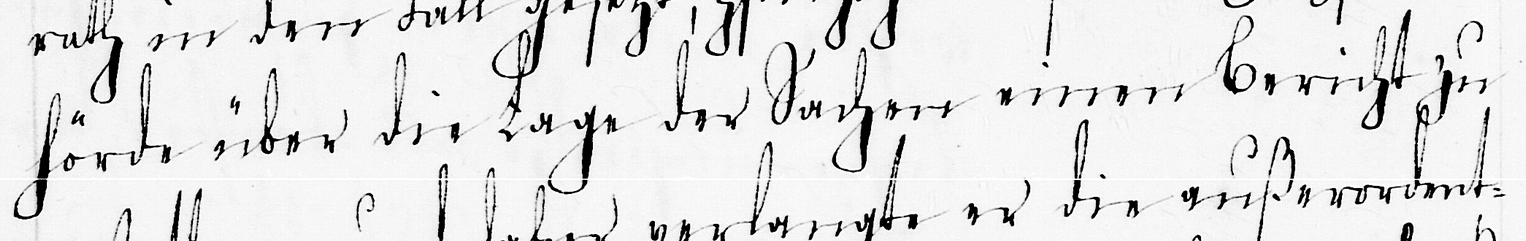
hörde über die Lage der Sachen einen Bericht zu
